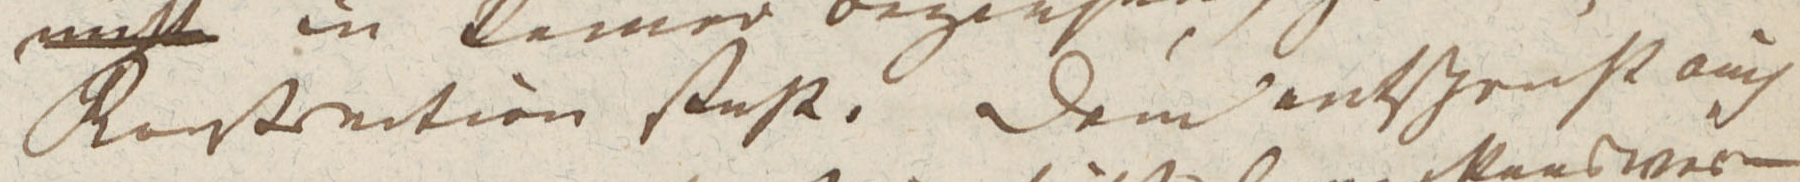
Konstruction steht. Dem entspricht auch
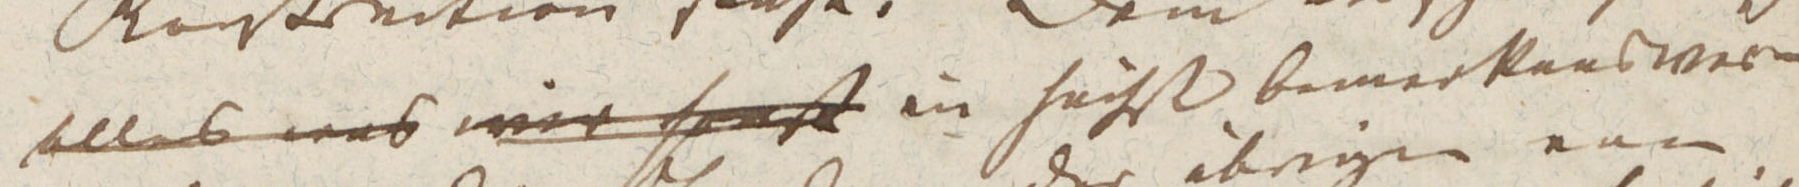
alles was wir sonst in höchst bemerkenswer-
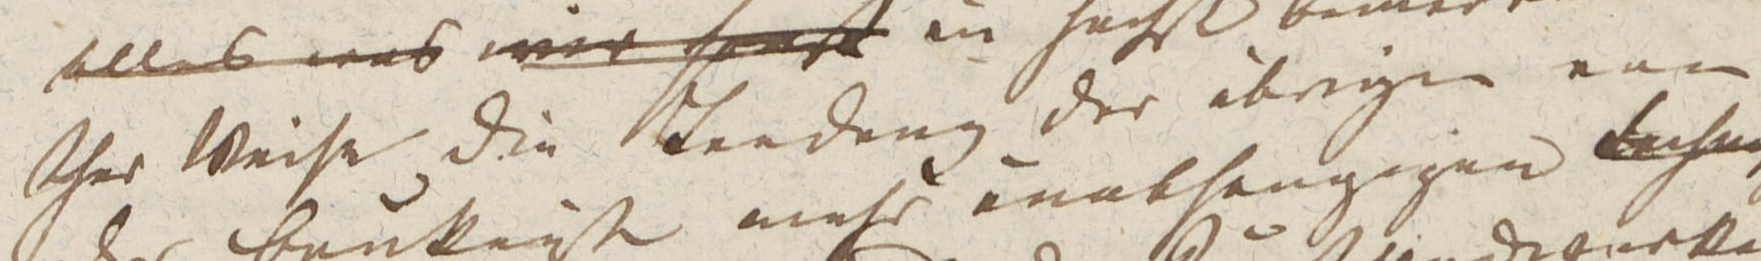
ther Weise die Tendenz der übrigen von
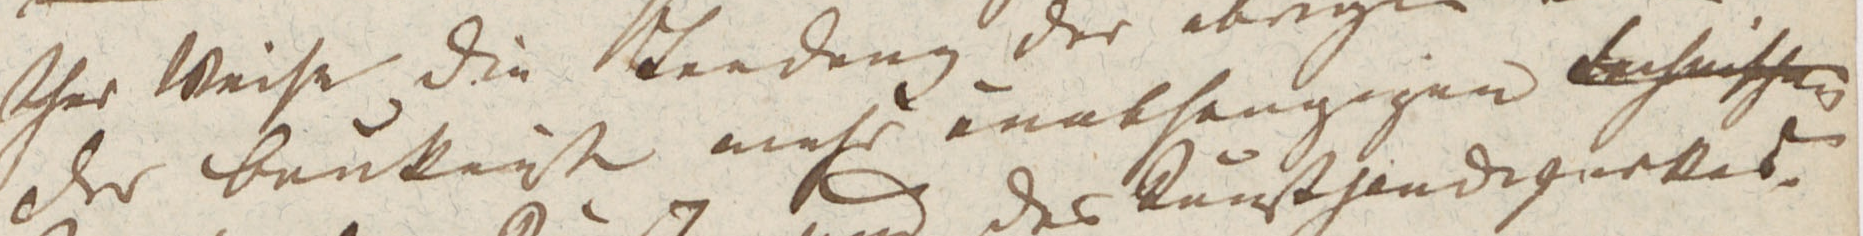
der Baukunst mehr unabhangigen technischen
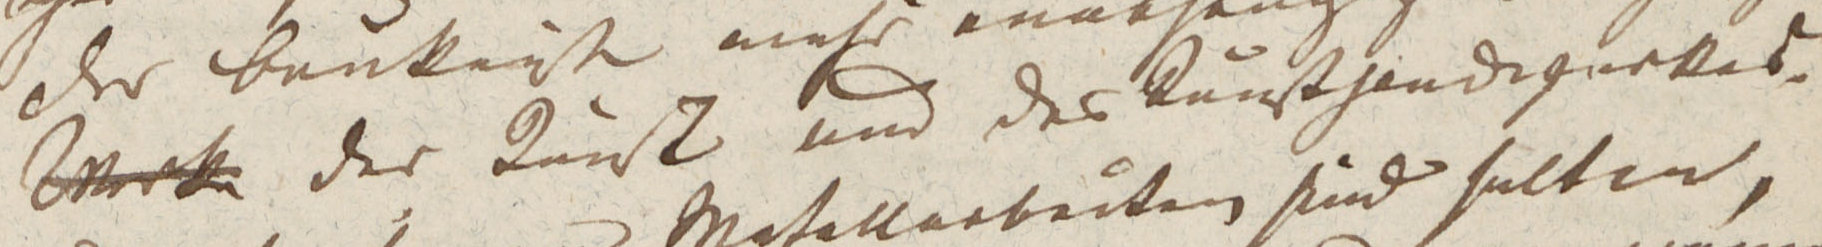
Werk der Kunst und des Kunsthandwerkes.
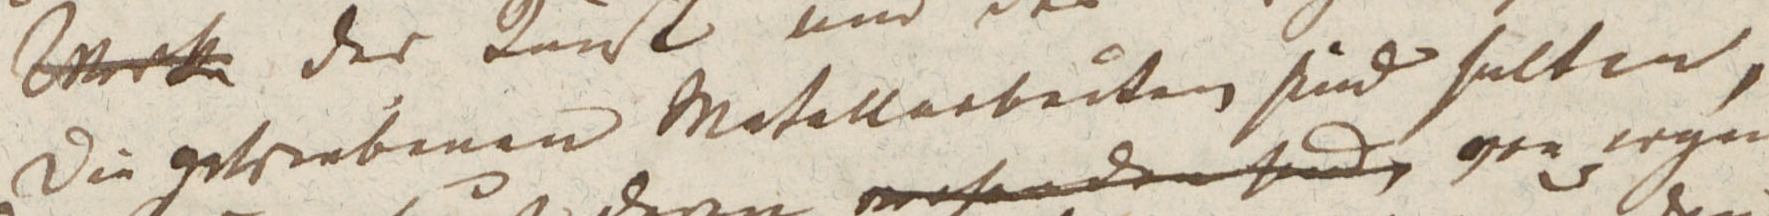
Die getriebenen Metallarbeiten sind selten,
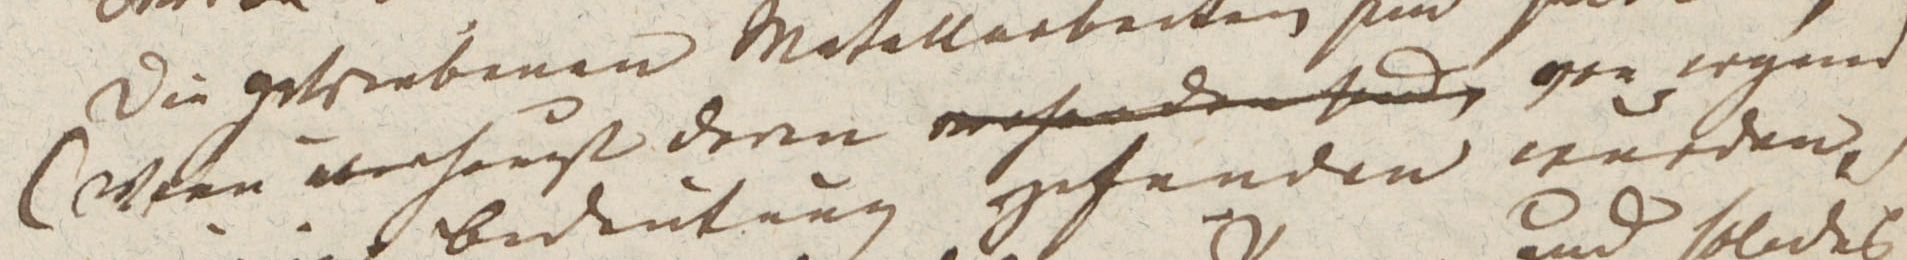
(wenn überhaupt deren vorhanden sind, von irgend
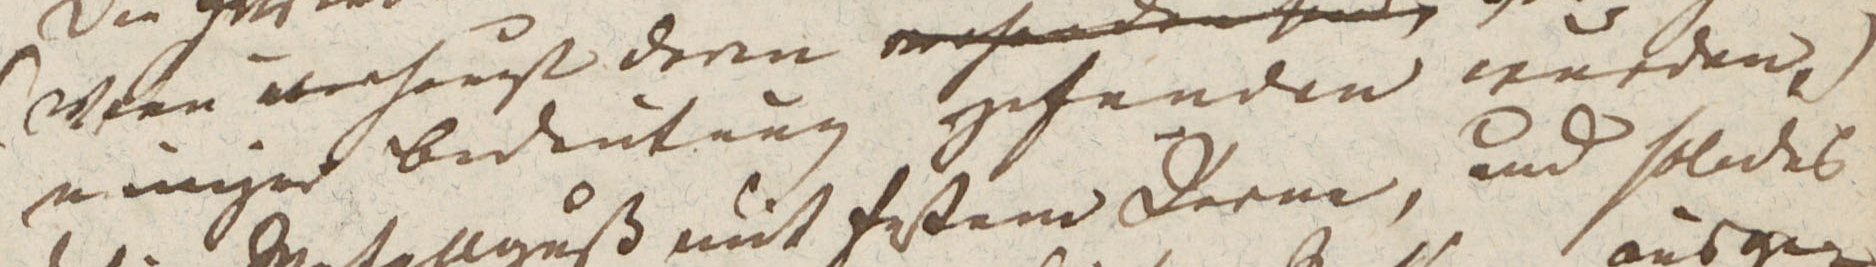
einiger Bedeutung gefunden wurden,
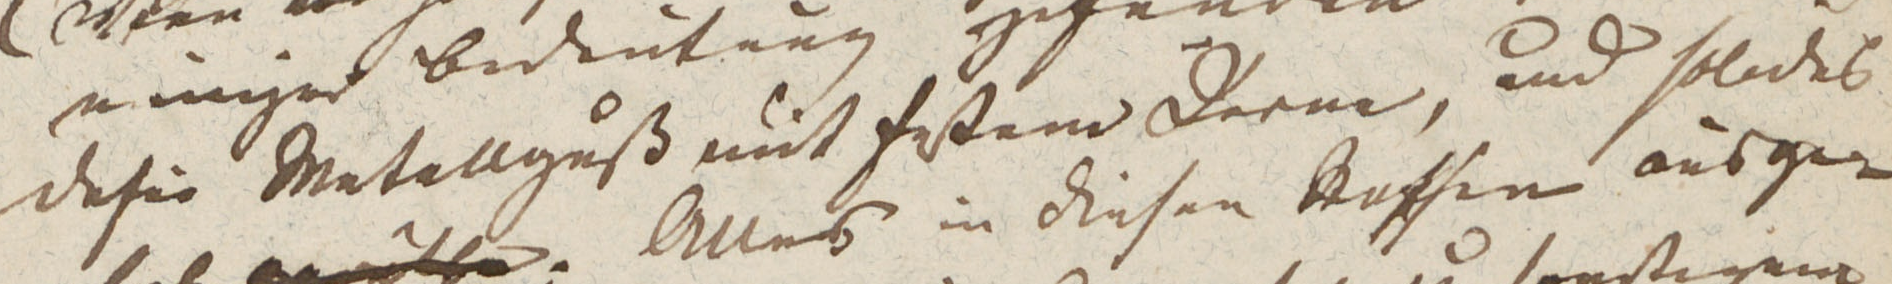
dafür Metallguss mit festem Kerne, und solides
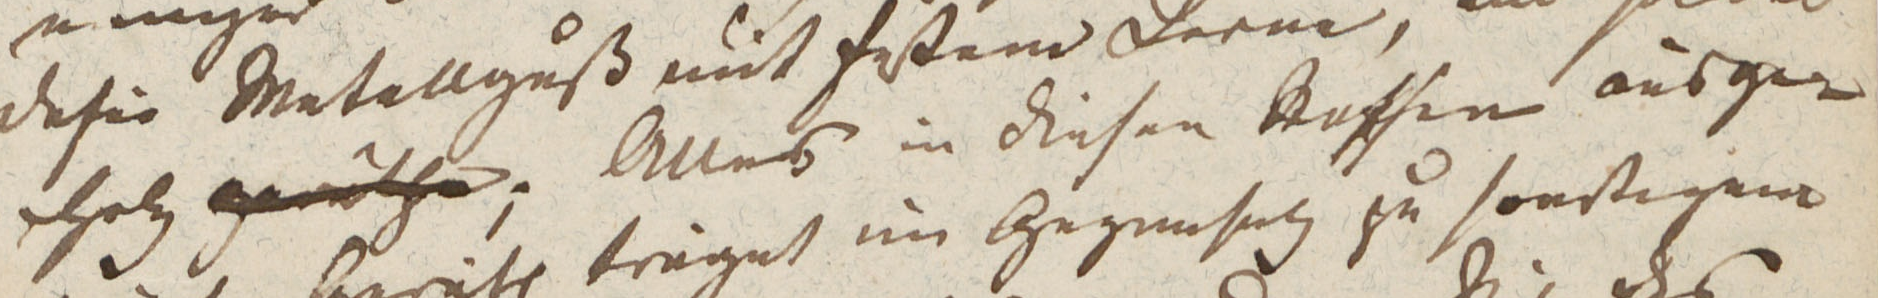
Holz geräthe; Alles in diesen Stoffen ausge-
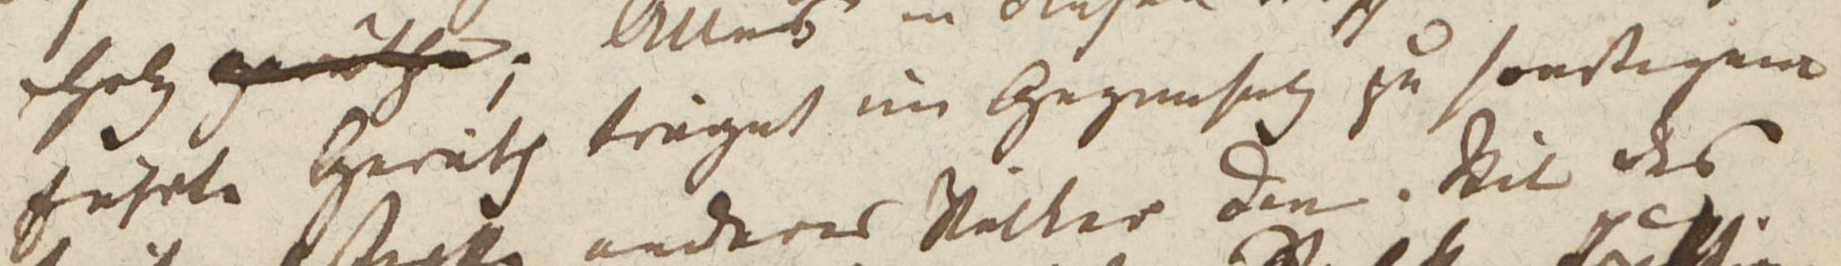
führte Geräth träget im Gegensatz zu sonstigem
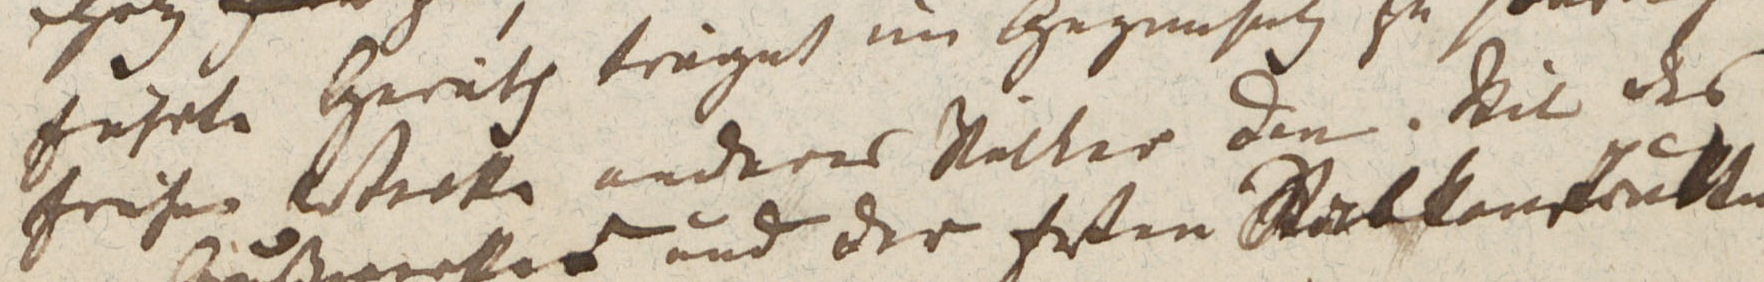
frühen Werke anderer Völker den Stil des
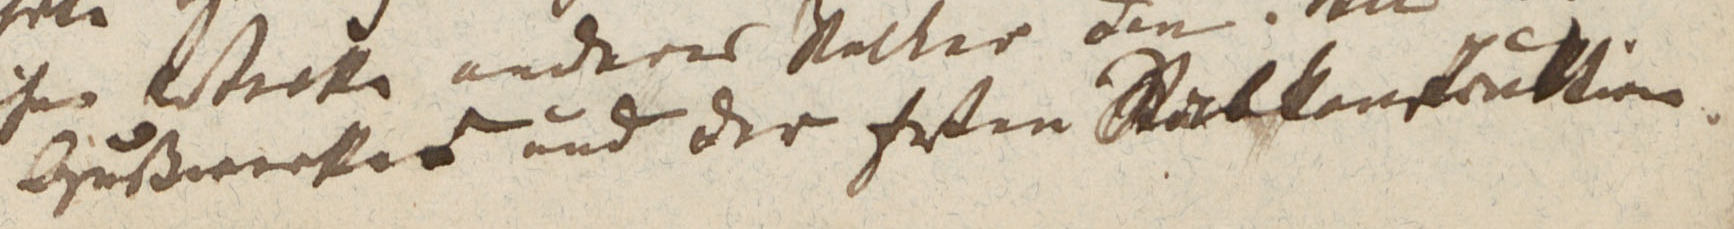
Gusswerkes und der festen Stabkonstruktion.
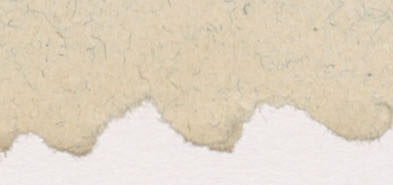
% directen
